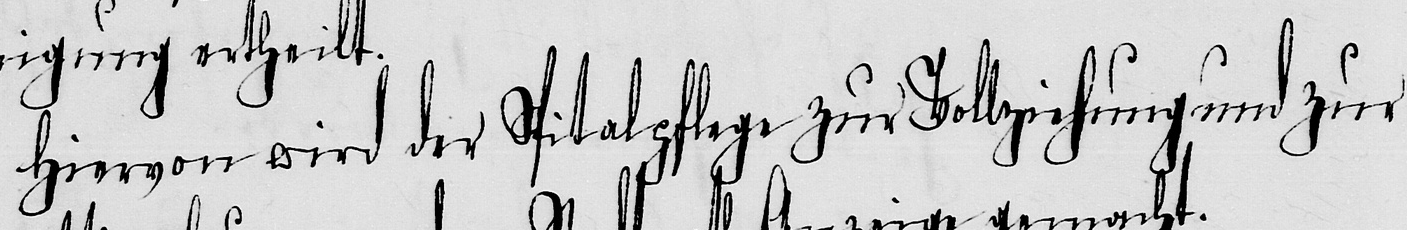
Hiervon wird der Spitalpflege zur Vollziehung und
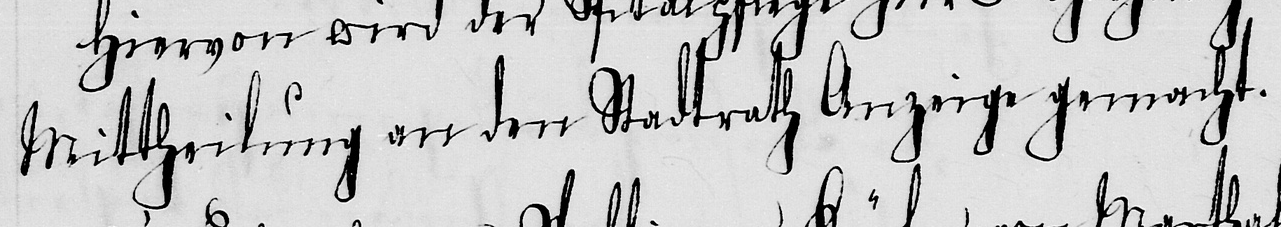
Mittheilung an den Stadtrath Anzeige gemacht.
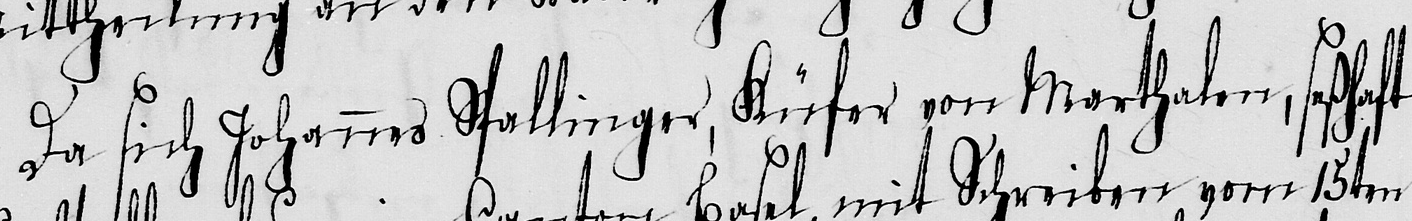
Da sich Johannes Spallinger, Küfer von Marthalen, seßha¬
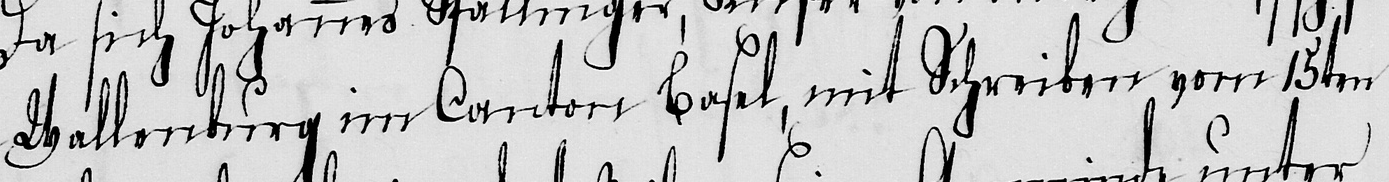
Wallenburg im Canton Basel, mit Schreiben vom 15ten
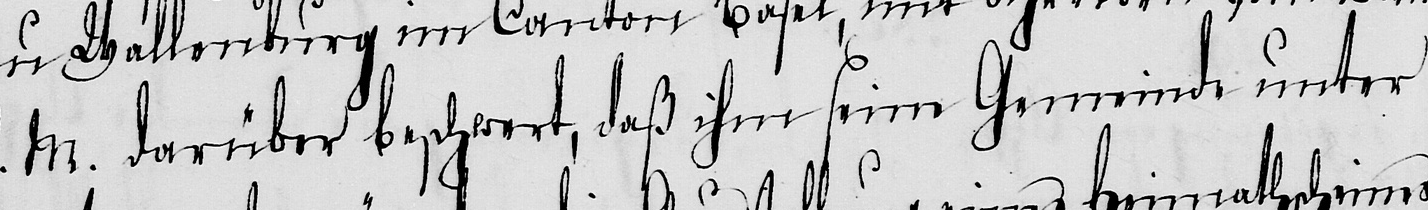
M. darüber beschwert, daß ihm seine Gemeinde unter
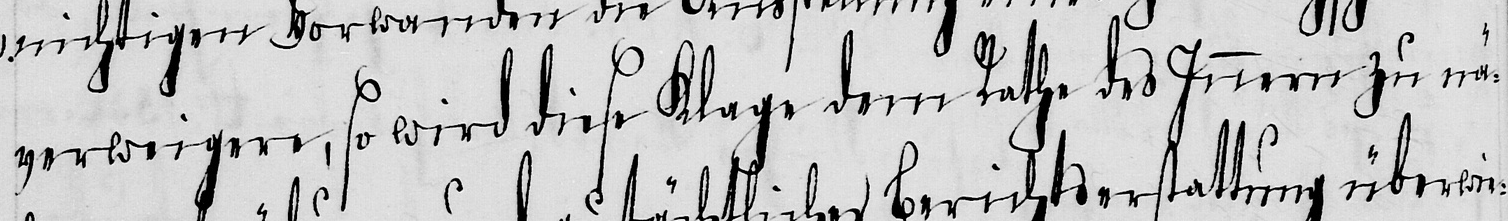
verweigere, so wird diese Klage dem Rathe des Innern zu nä¬
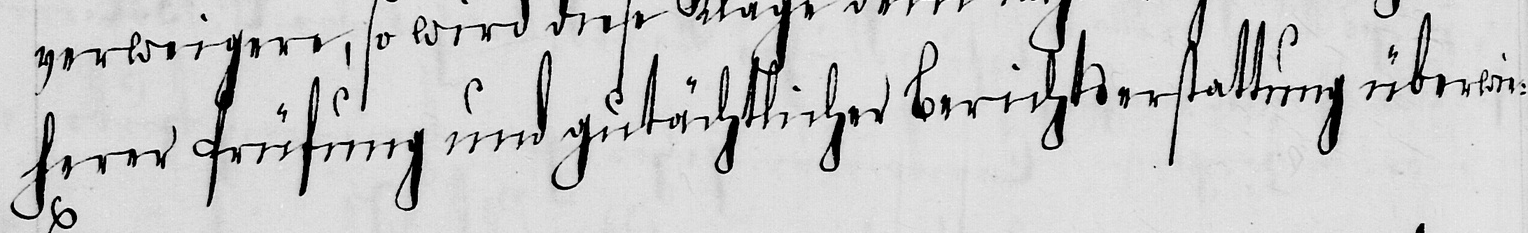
herer Prüfung und gutächtlicher Berichterstattung überwi¬
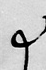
d.
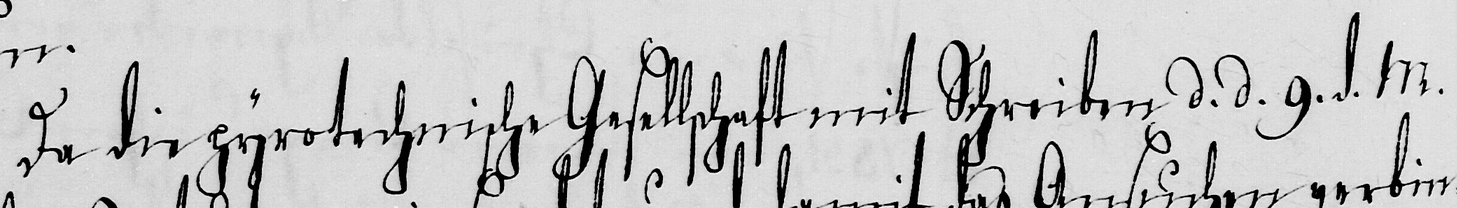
Da die pyrotechnische Gesellschaft mit Schreiben d. d. 9. d.
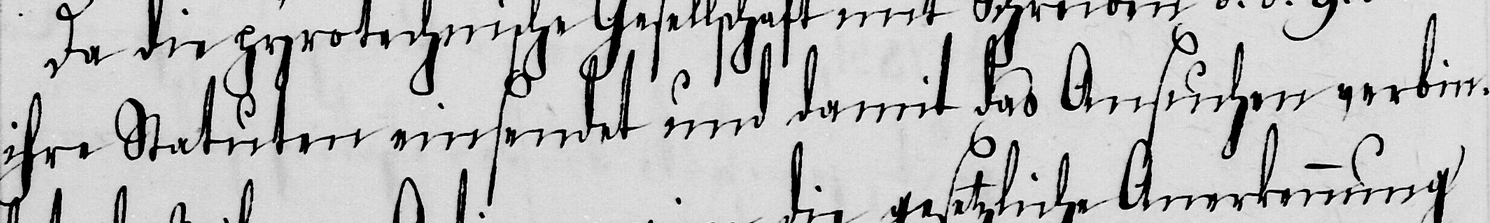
ihre Statuten einsendet und damit das Ansuchen verbin¬
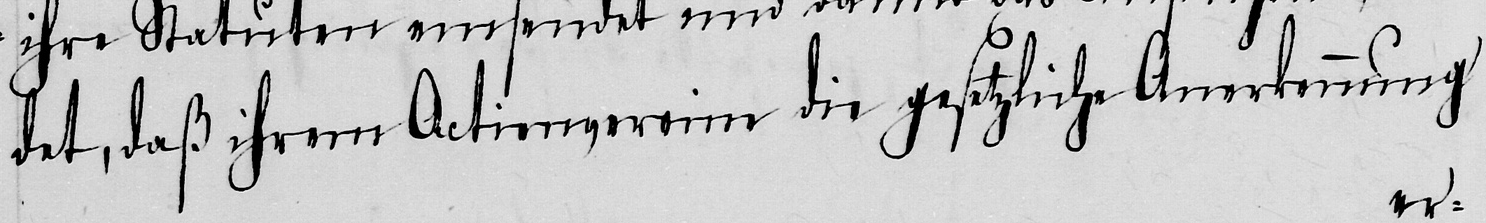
det, daß ihrem Activenvereine die gesetzliche Anerkennung
